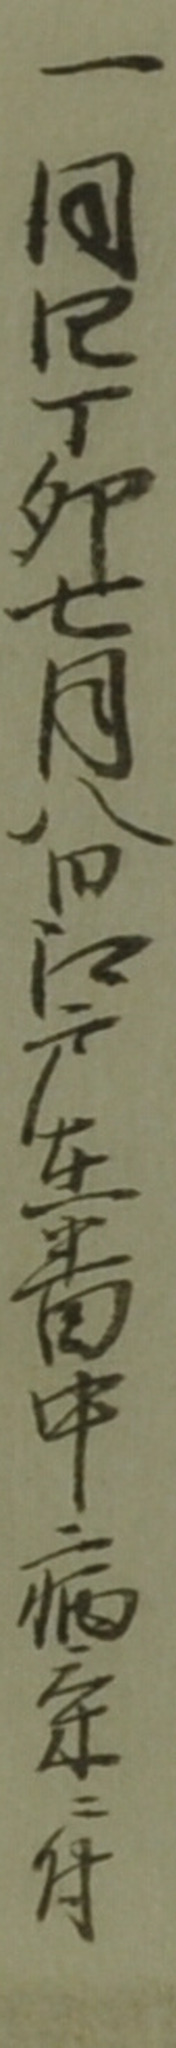一同四丁卯七月八日江戸在番中病気ニ付
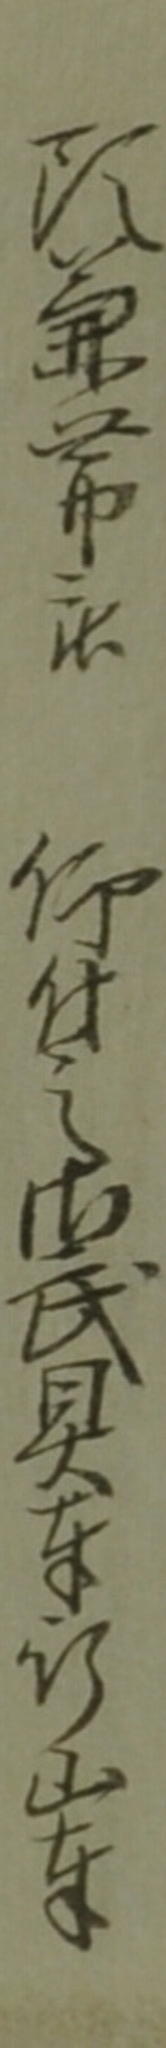頭兼帯被仰付之御武具奉行山奉
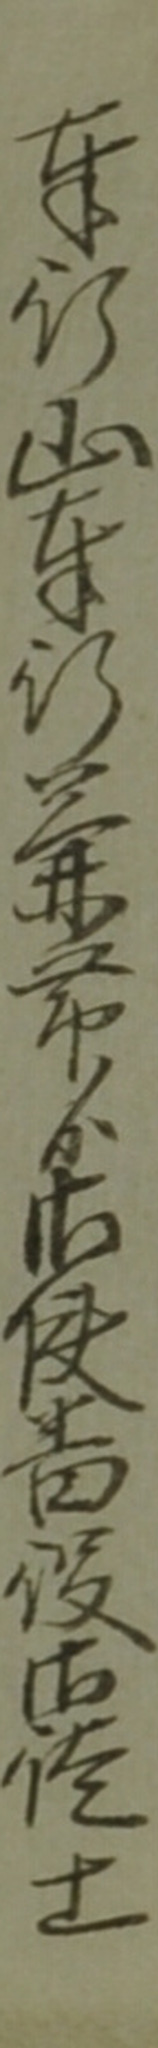奉行山奉行兼帯ゟ御使番役御徒士
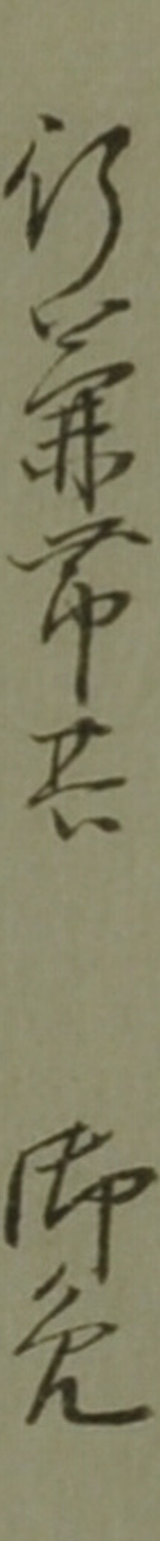行兼帯共御免
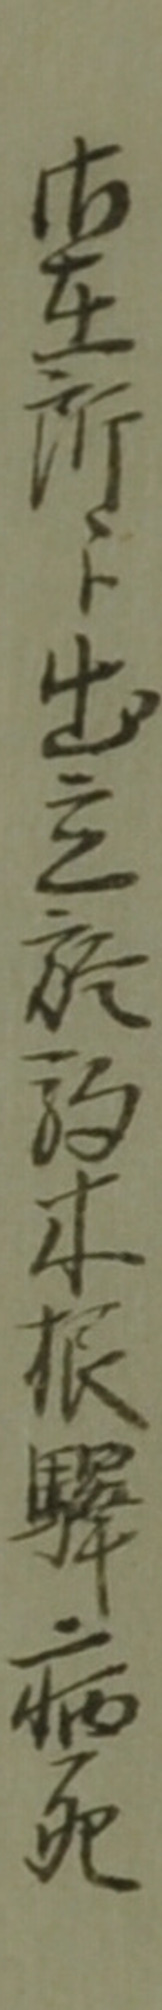御在所江出立於◻︎木根駅病死
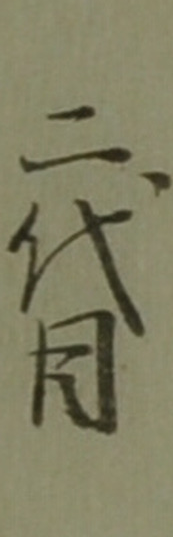二代目
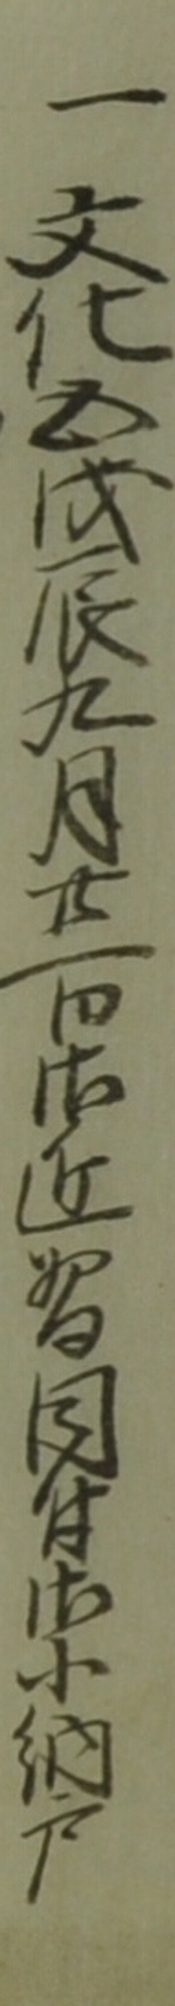一文化五戊辰九月廿一日御近習目付御小納戸
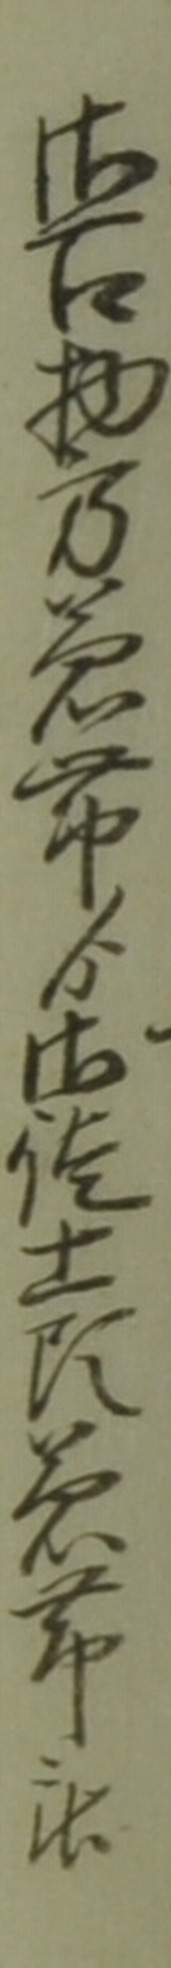御召物方兼帯ゟ御徒士頭兼帯被
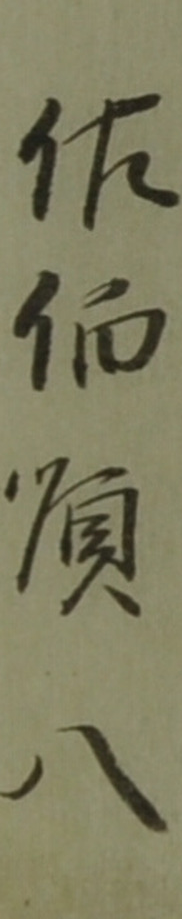佐伯順八

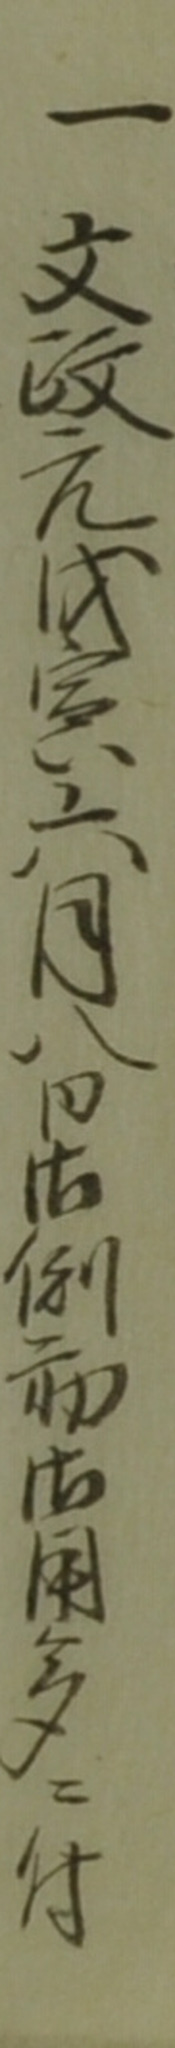一文政元戊寅六月八日御側勤御用多ニ付
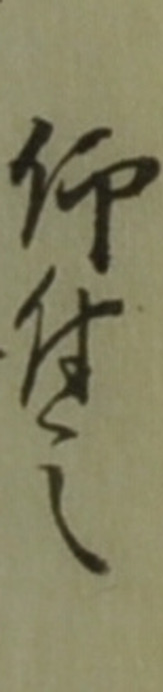仰付之
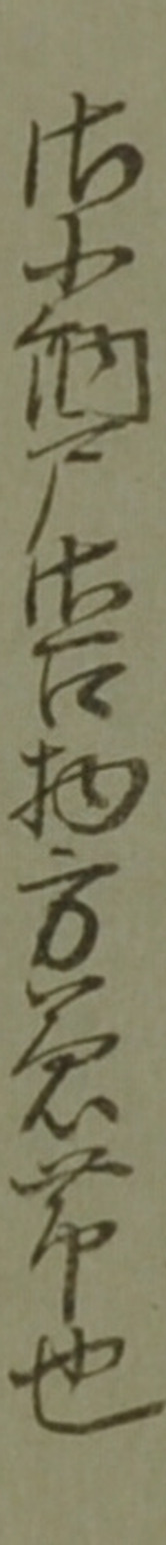御小納戸御召物方兼帯也
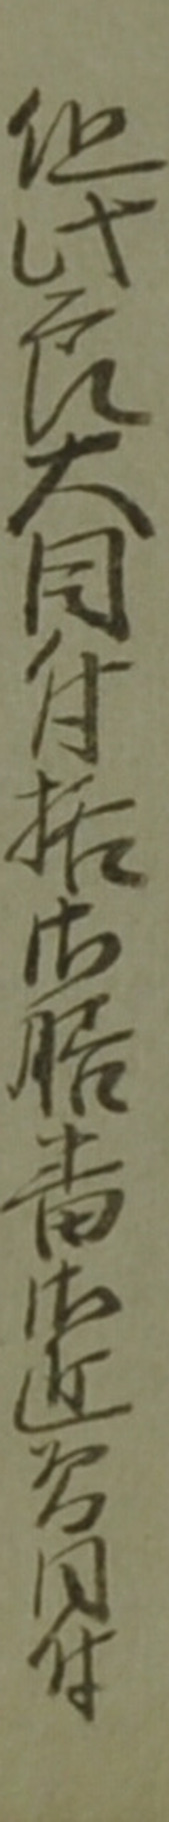但此節大目付格御膳番御近習目付
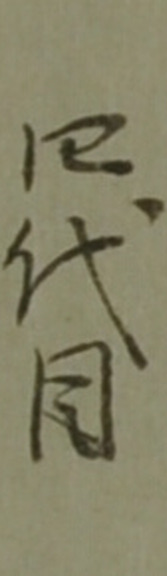四代目
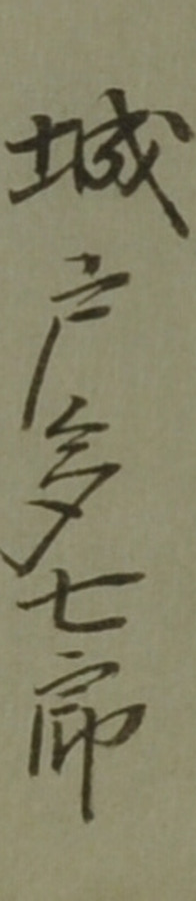城戸多七郎
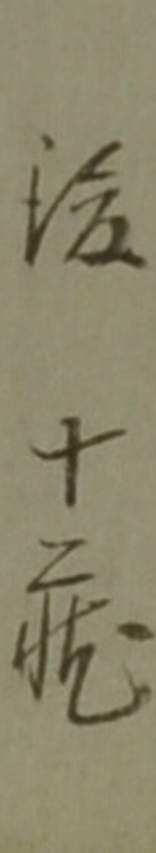後十蔵
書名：諸御役代々録（六）
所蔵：伊那市立高遠町図書館・合同会社AMANE
